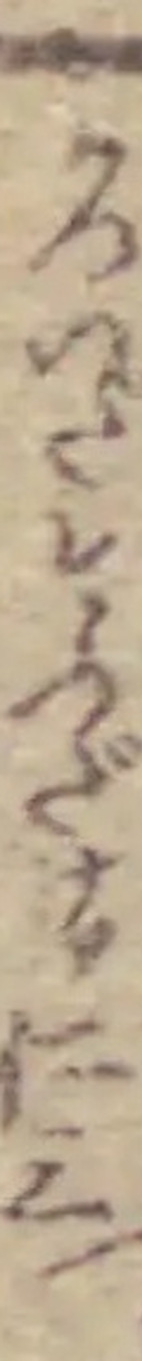かついだそうだナア仁三
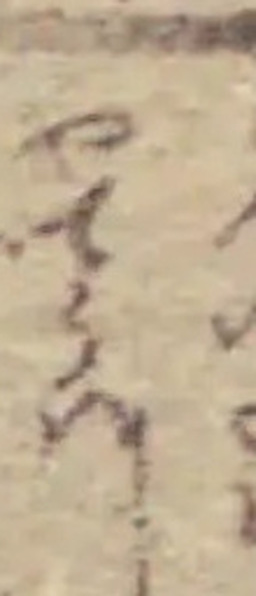やてうは
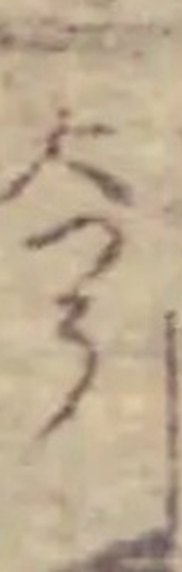大つう
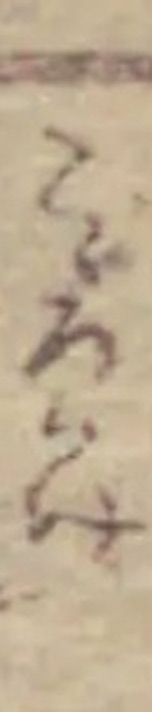こゝろかけ
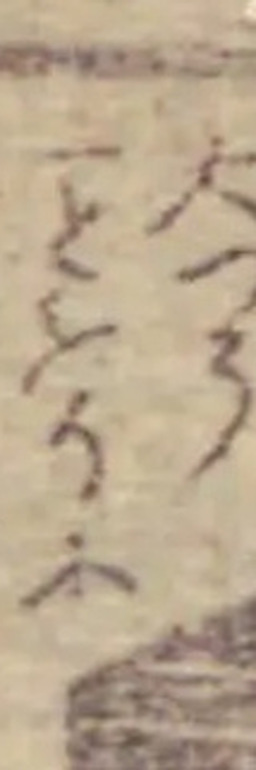一とふりに
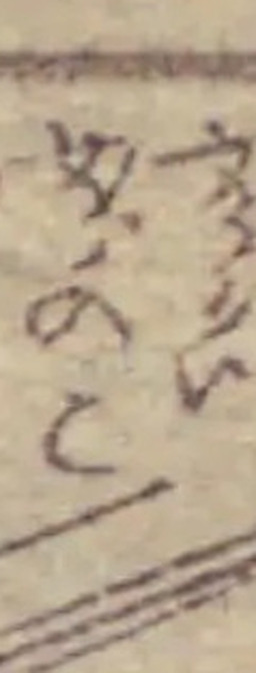女郎のこ
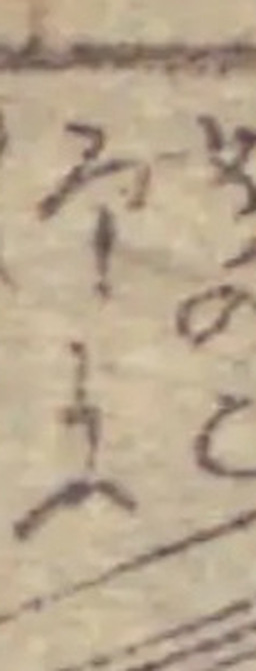ろしよふ
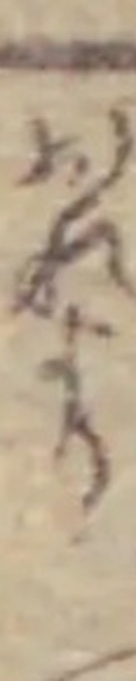おれより
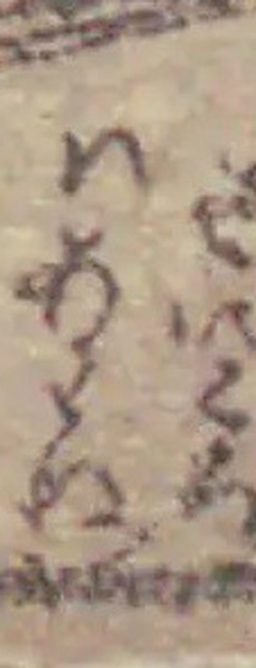はあわぬ
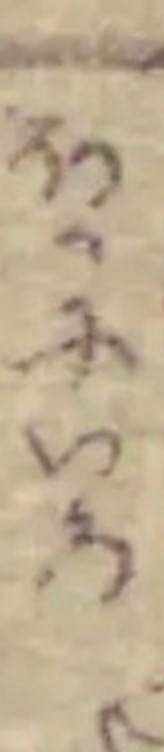ほかにいろ
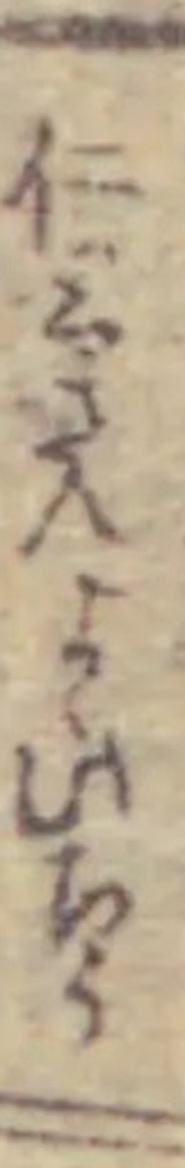仁三さんよく此ちう
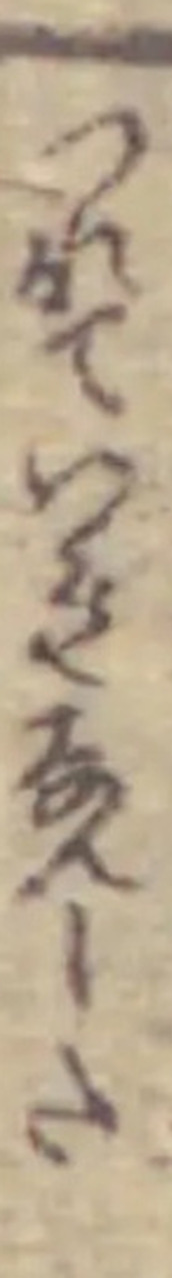つれていきなんした
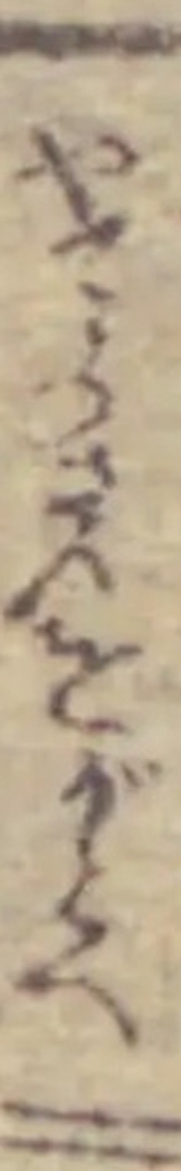やてうさんをがとへ
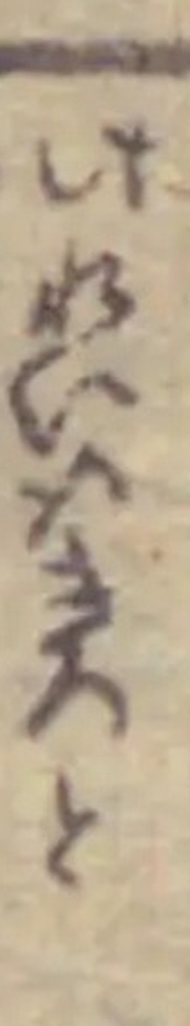此れいはきつと
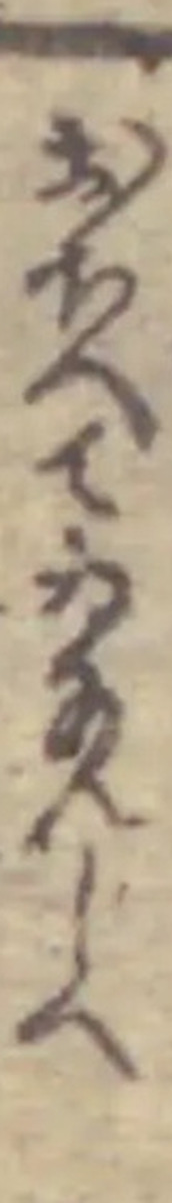おほへてゐなんしへ
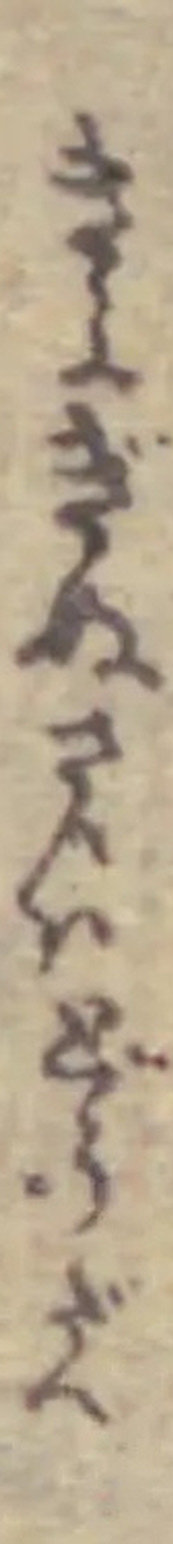きよぎぬさんはどうだん
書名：夜野中狐物 2巻
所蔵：国立国会図書館 National Diet Library, JAPAN
